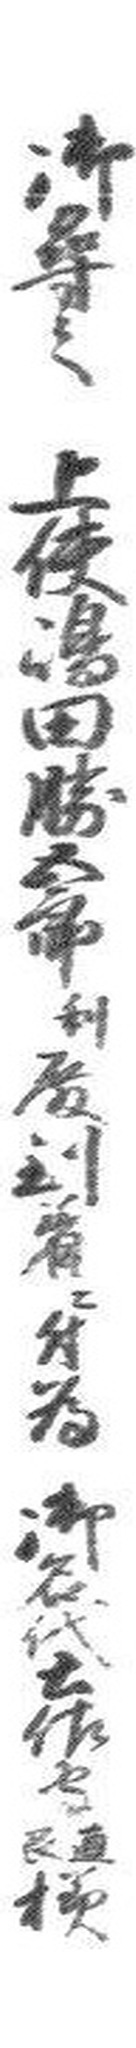御尋之上使嶋田勝五郎利殿到着ニ付為御名代土佐守直良様
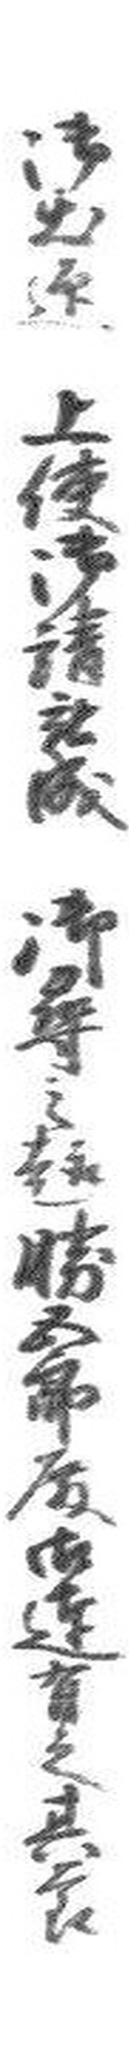御出迎上使御請被成御尋之趣勝五郎殿御達有之其節
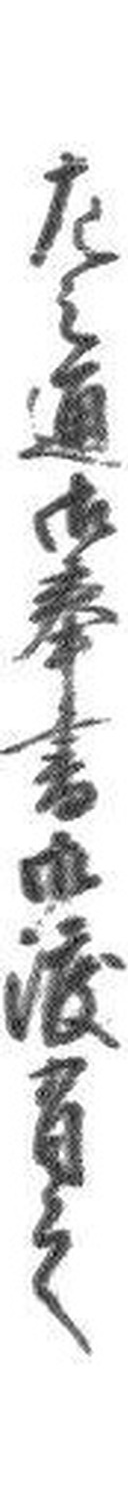左之通御奉書御渡有之

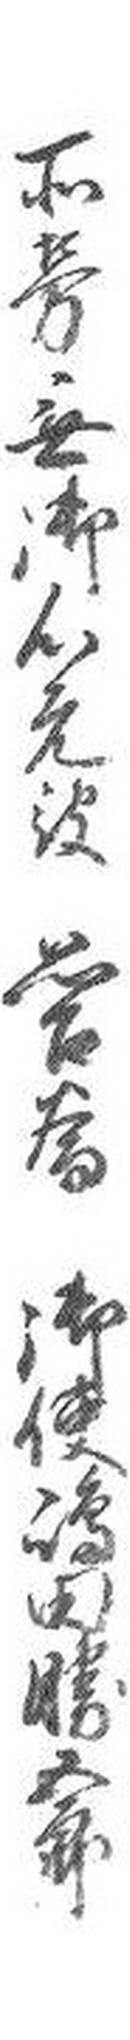所労無御心元被思召為御使嶋田勝五郎
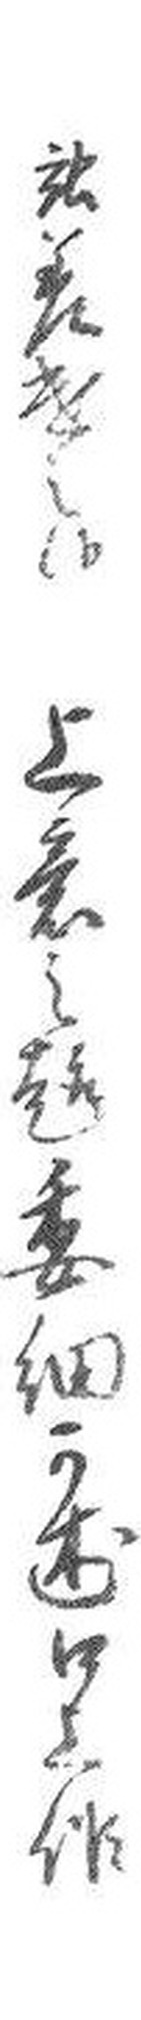被差遣之候上意之趣委細可述口上候
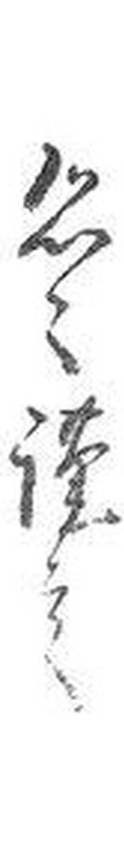恐々謹言
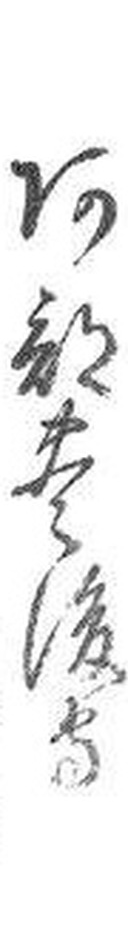阿部豊後守
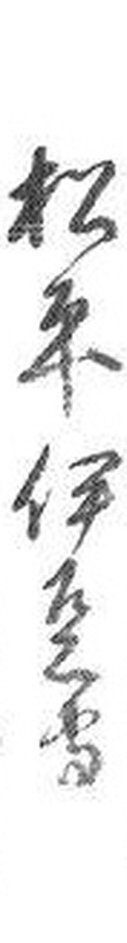松平伊豆守
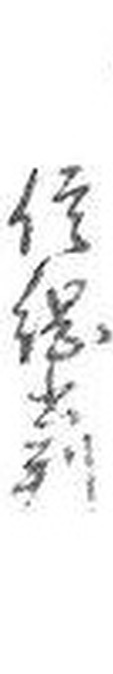信綱書判
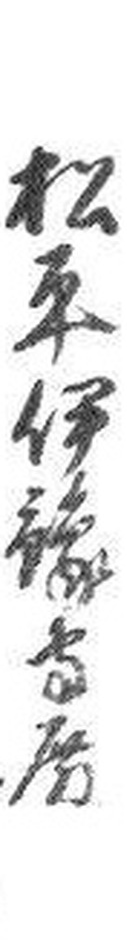松平伊予守殿
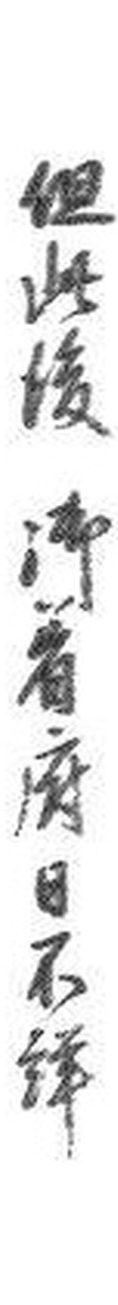但此後御着府日不詳
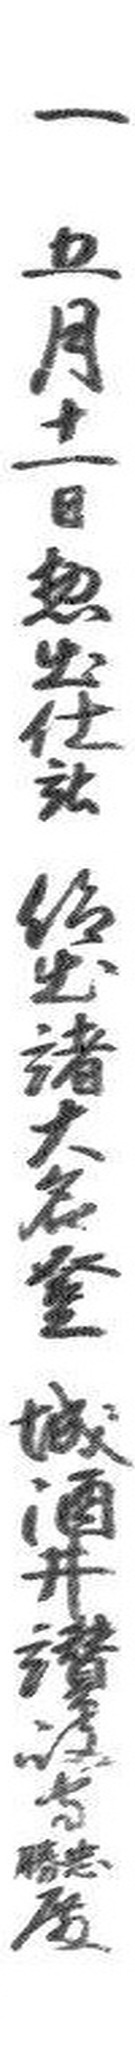一五月十一日惣出仕被仰出諸大名登城酒井讃岐守忠勝殿
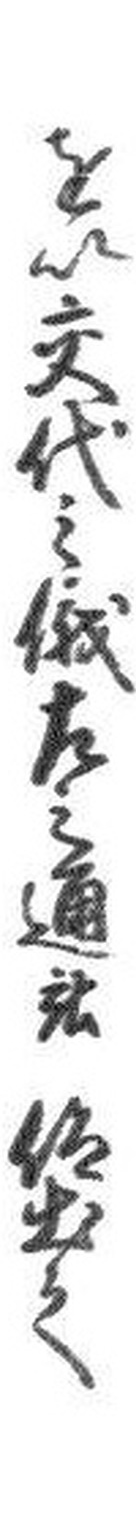を以交代之儀左之通被仰出之
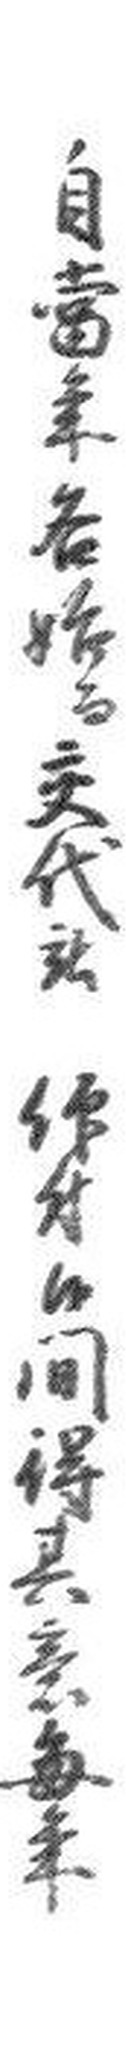自当年各始而交代被仰付候間得其意毎年
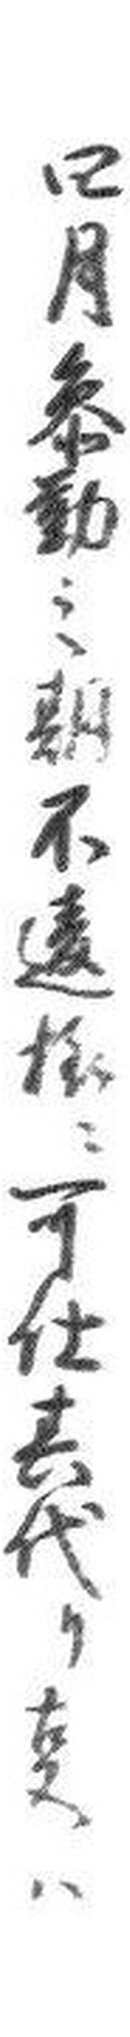四月参勤之期不違様ニ可仕其代リ事ハ
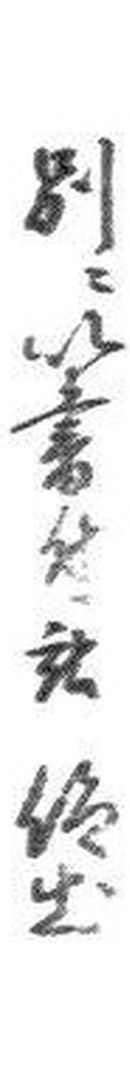別ニ以書付被仰出
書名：家譜 四 忠昌公 従寛永七年到正保四年
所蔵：福井県文書館 Fukui Prefectural Archives
